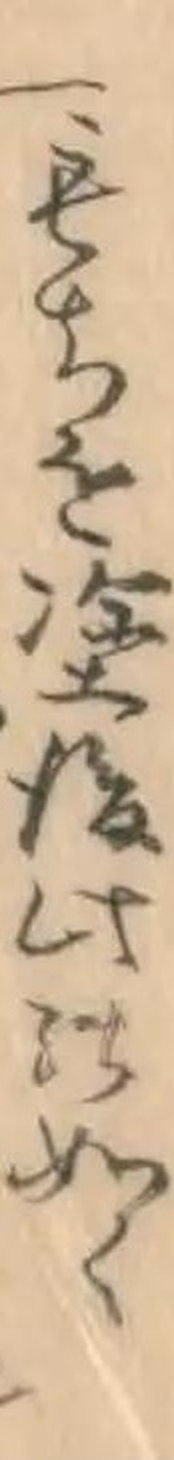もちを塗後此の如く
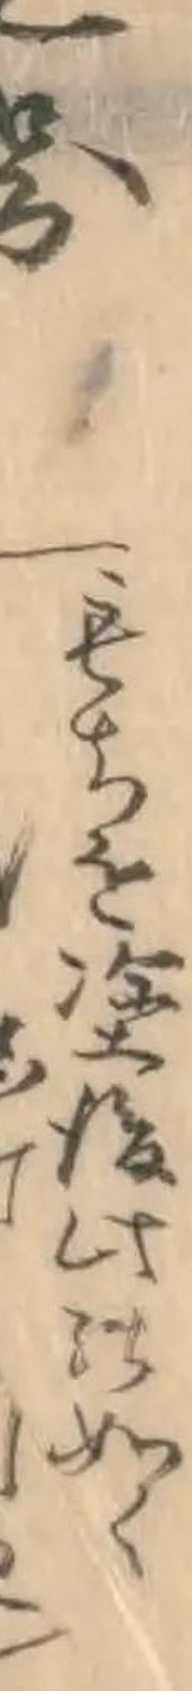もちを塗後此の如く
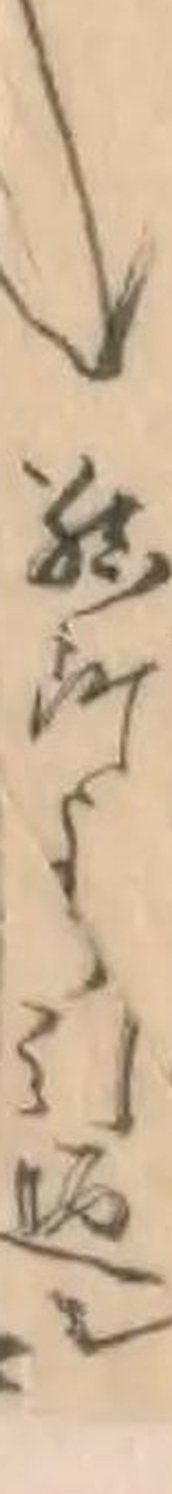結所より引返し置

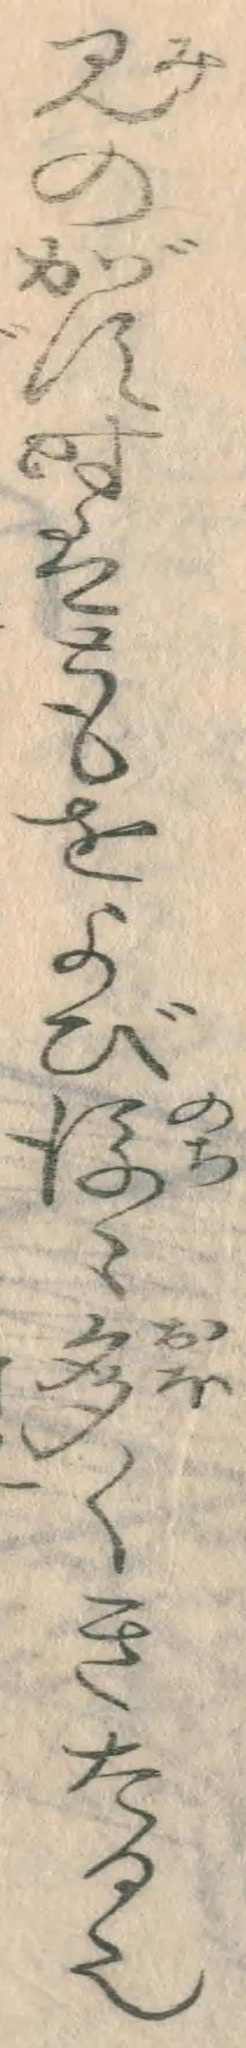見のがす時はともをよび後々多くきたる也
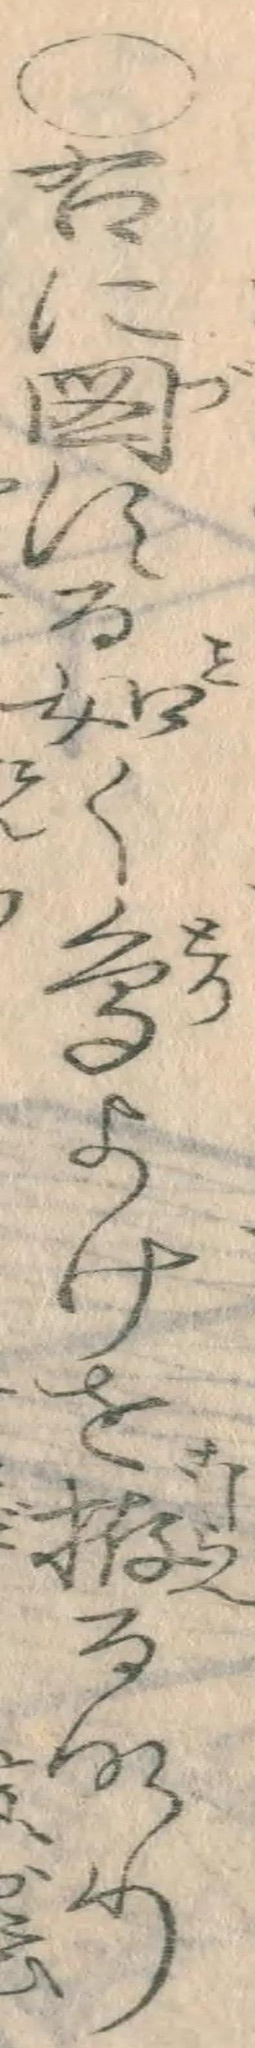○右に図する如く鳥よけを拵るなり
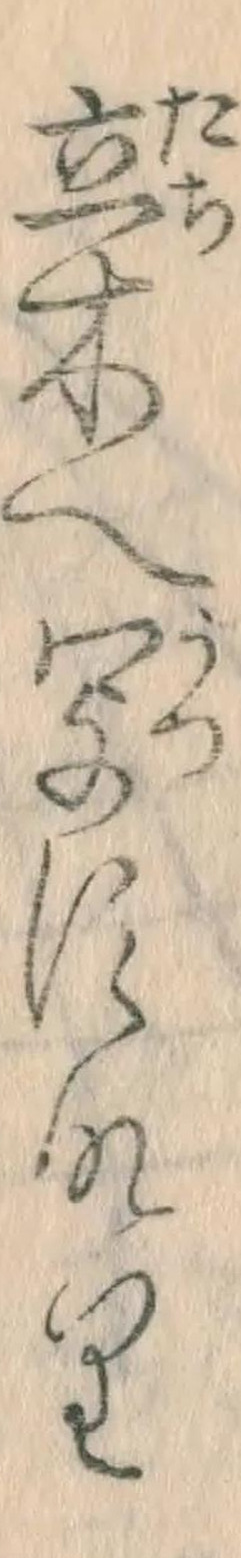立木へ写すなり
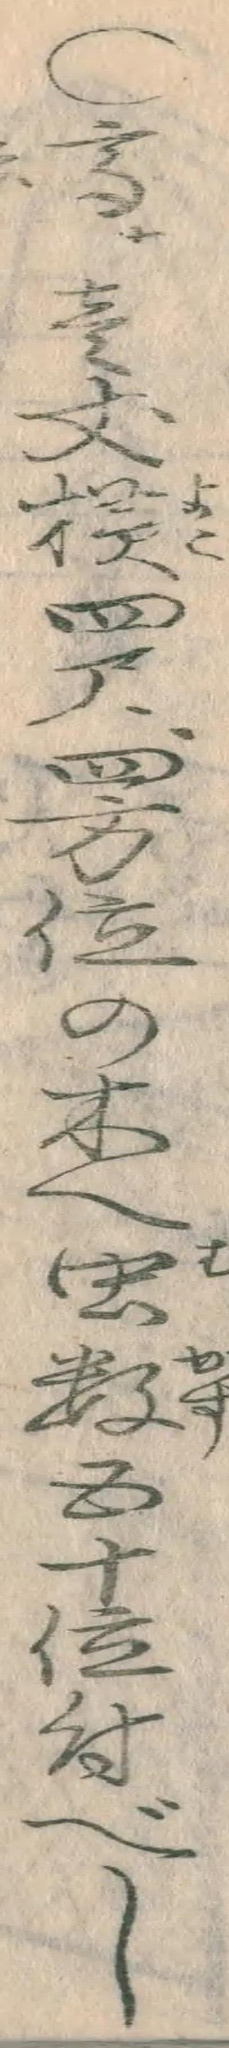○高さ壱丈横四尺四方位の木へ虫数五十位付べし
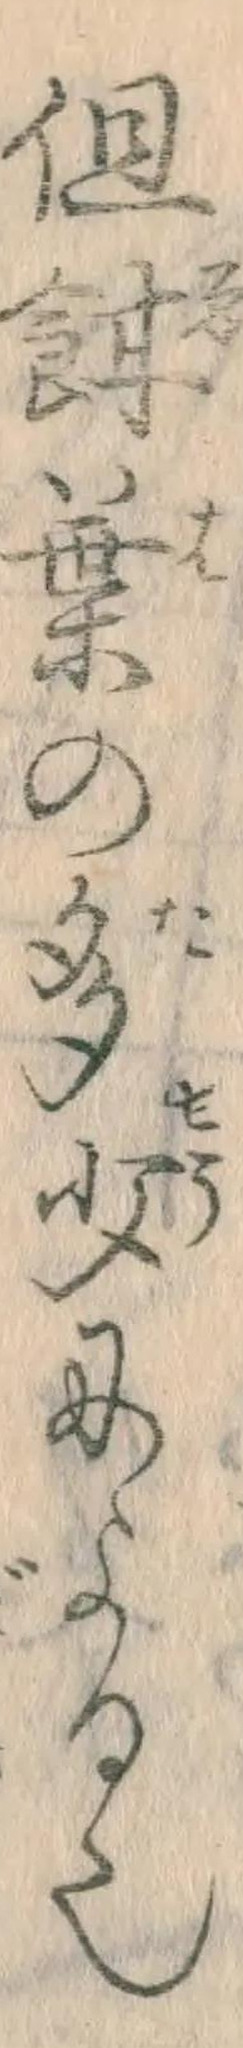但餌葉の多少による也
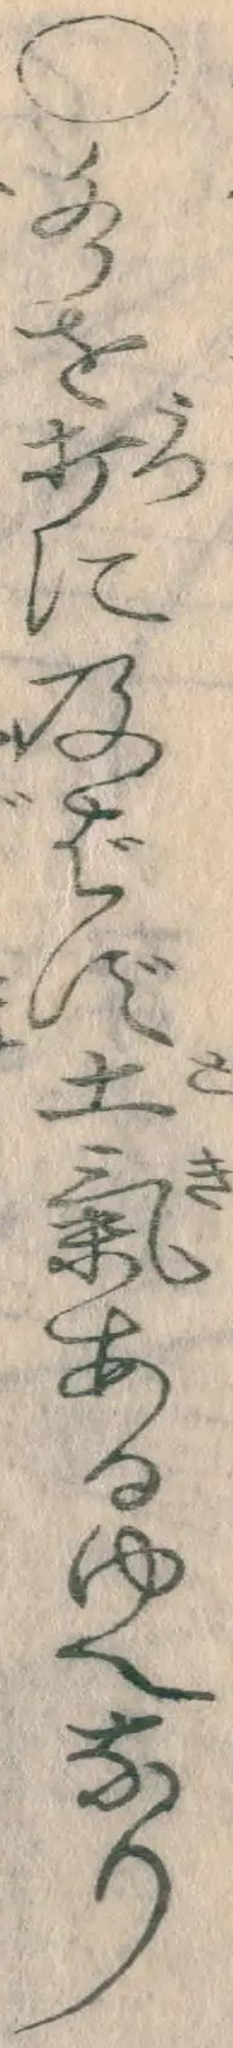○水を打に及ばず土気あるゆへなり
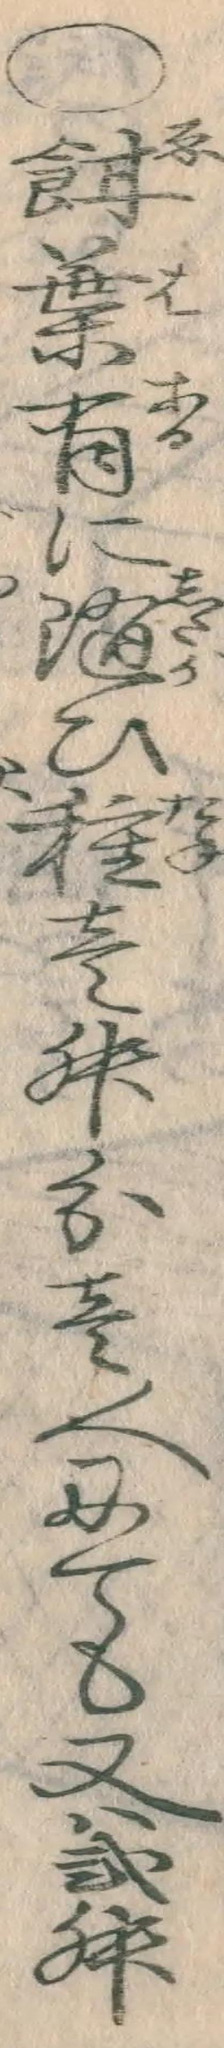○餌葉有に随ひ種壱升分壱人にても又は弐升
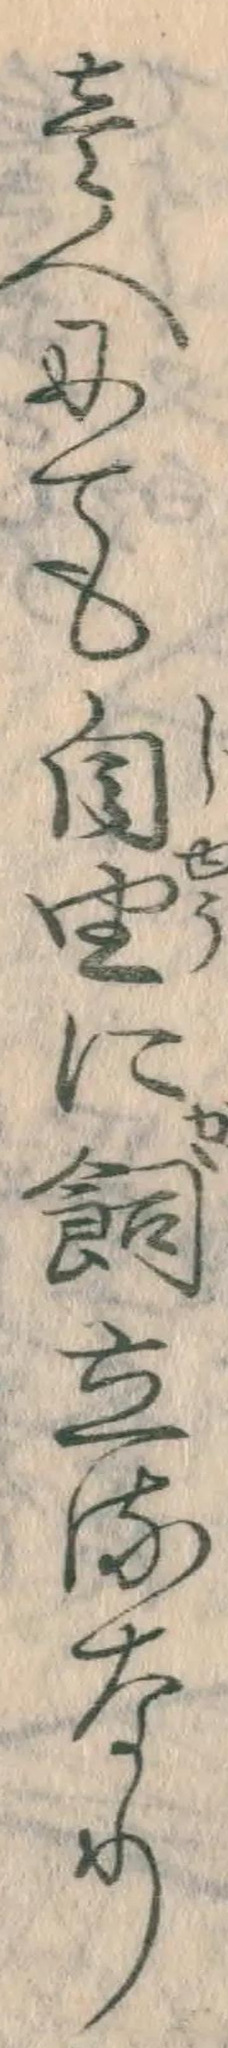壱人にても自由に飼立るなり
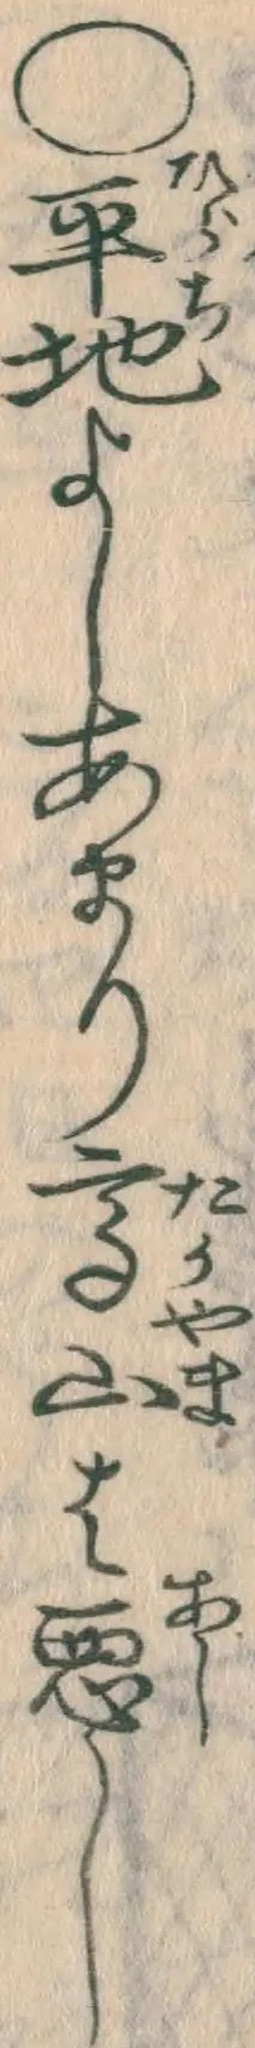○平地よしあまり高山は悪し
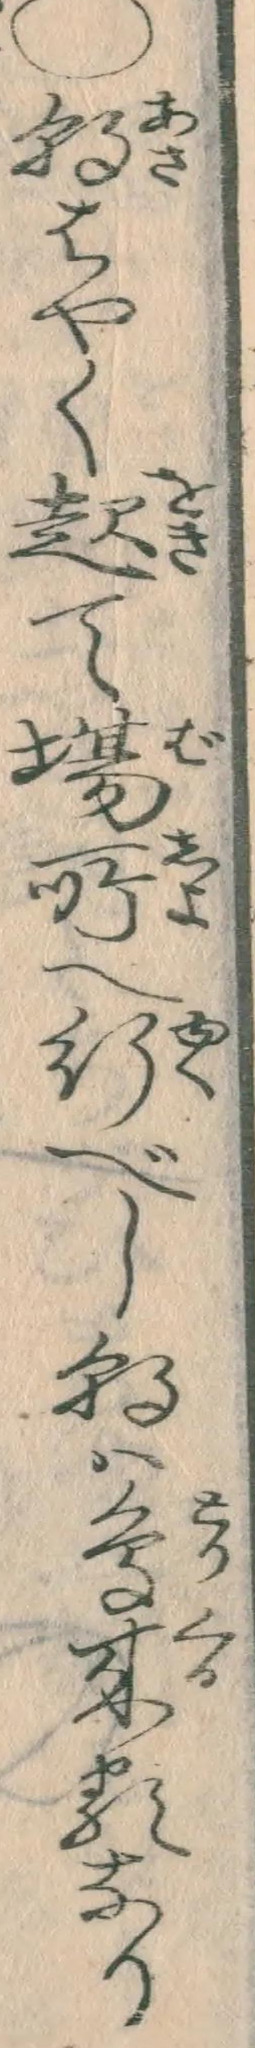○朝はやく起て場所へ行べし朝は鳥来るなり
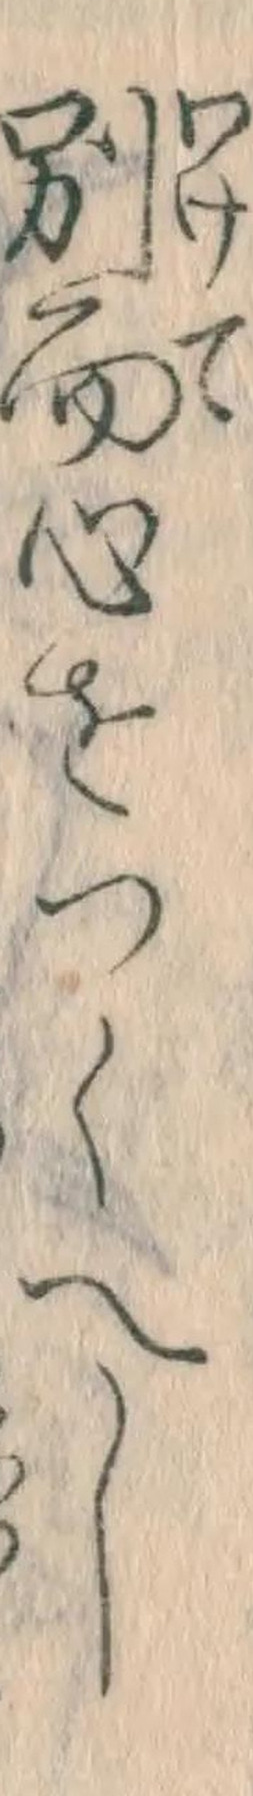別而心をつくへし
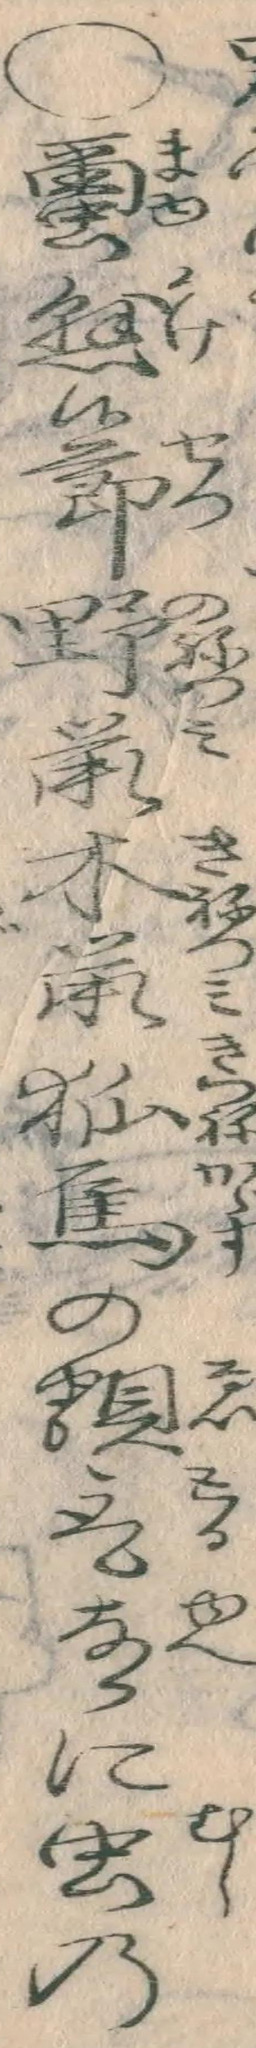○繭懸候節野鼠木鼠狐烏の類取故に虫の
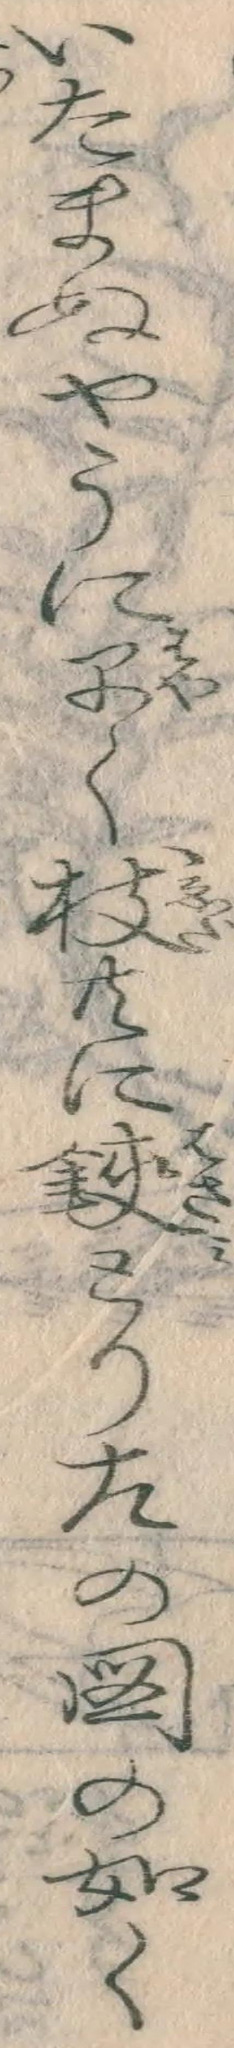いたまぬやうに早く枝共に鋏とり左の図の如く
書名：山繭養法秘傳抄
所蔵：国立国会図書館 National Diet Library, JAPAN
